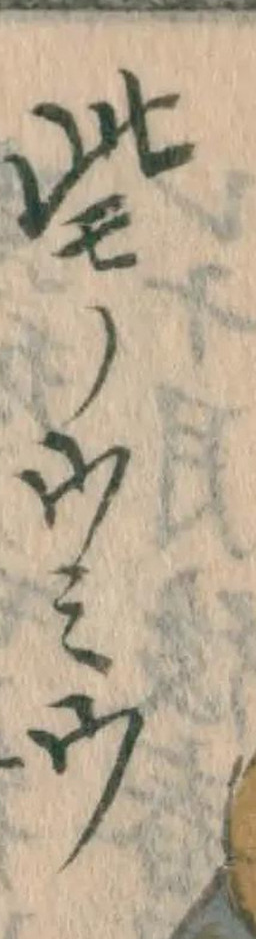此モノウミウ
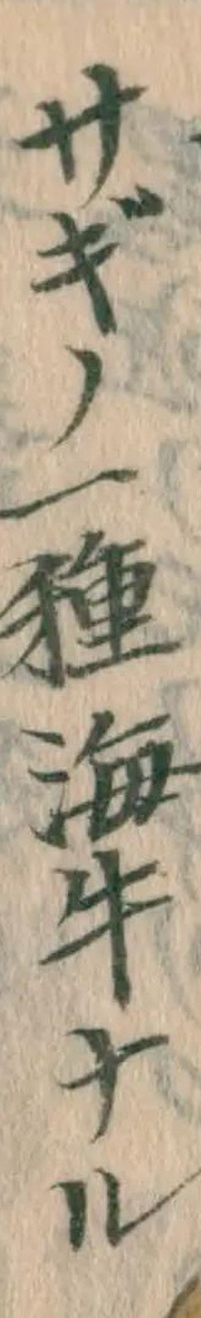サギノ一種海牛ナル
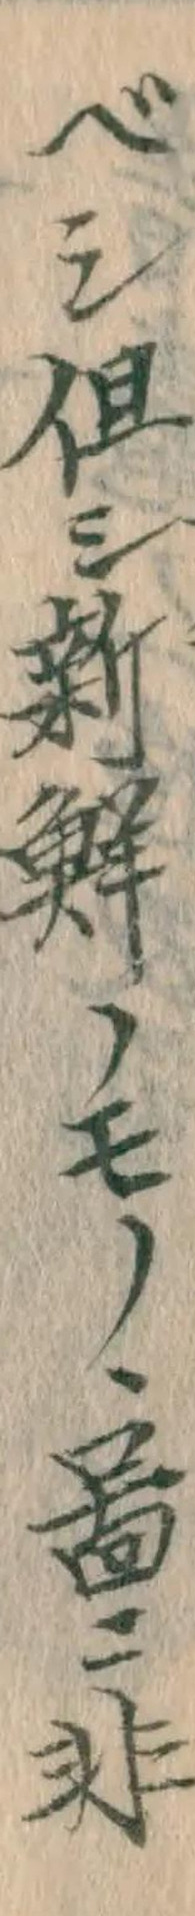ベシ但シ新鮮ノモノヽ啚ニ非
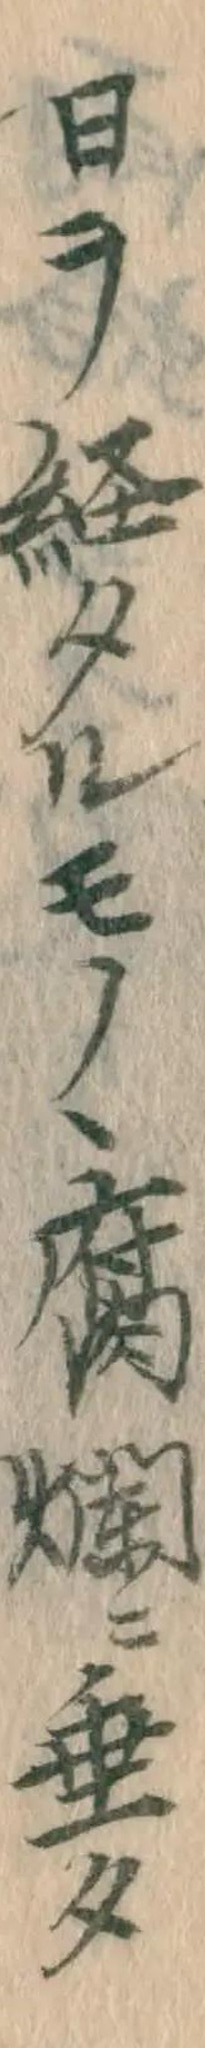日ヲ経タルモノヽ腐爛ニ垂タ
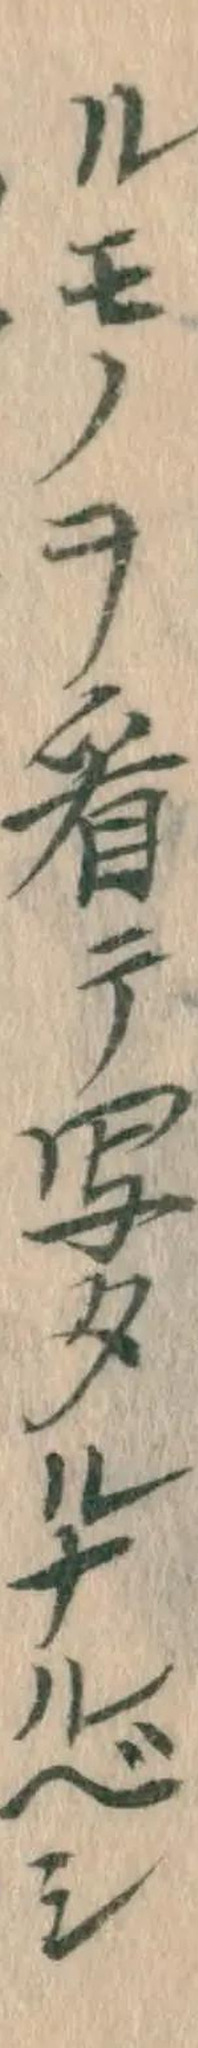ルモノヲ看テ写タルナルベシ
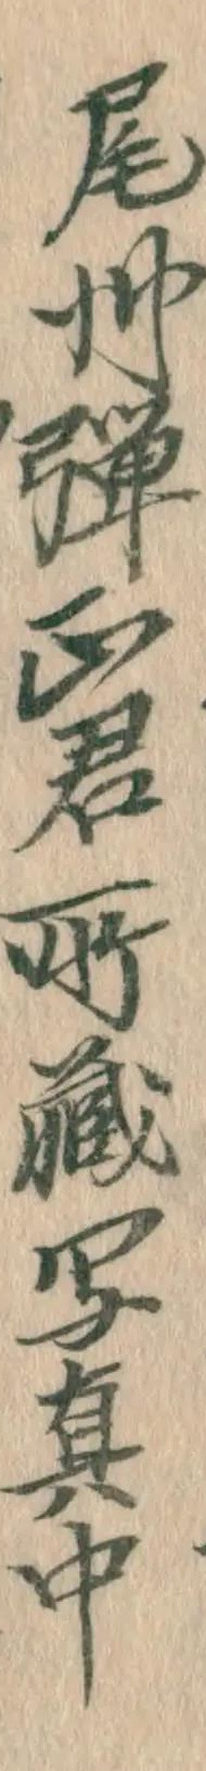尾州弾正君所藏写真中
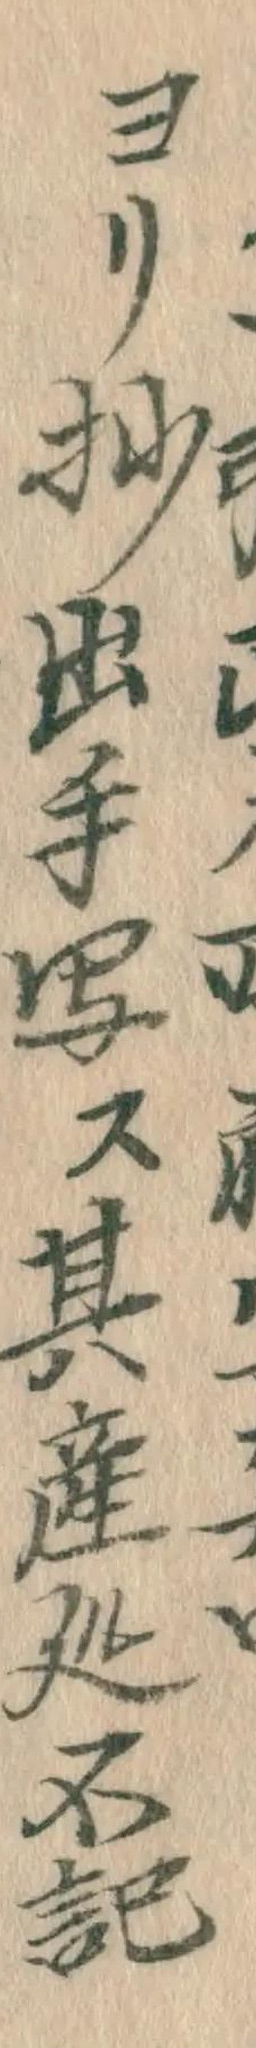ヨリ抄出手写ス其産処不記
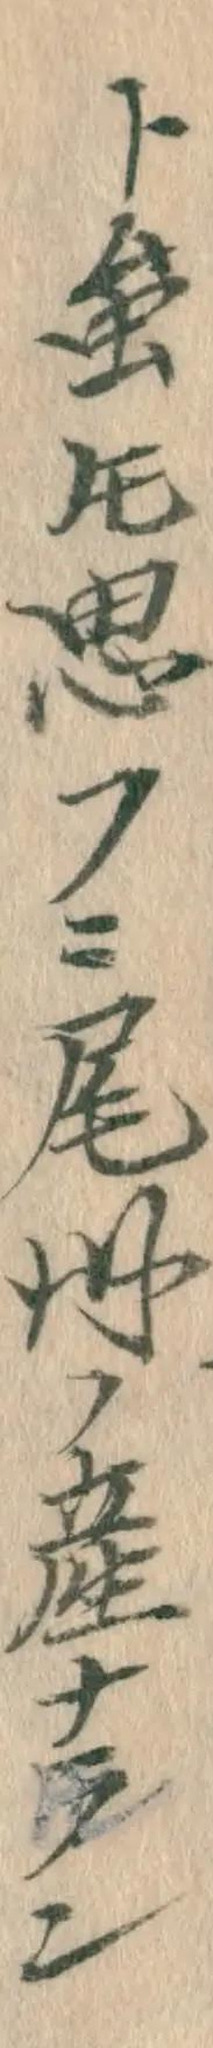ト虽トモ思フニ尾州ノ産ナラン

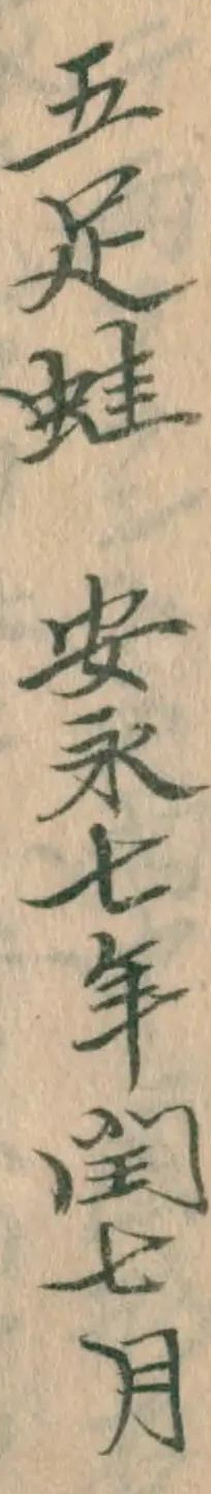五足蛙安永七年閏七月
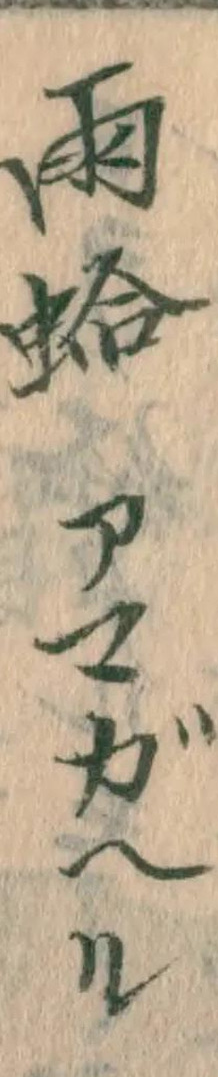雨蛤アマガヘル
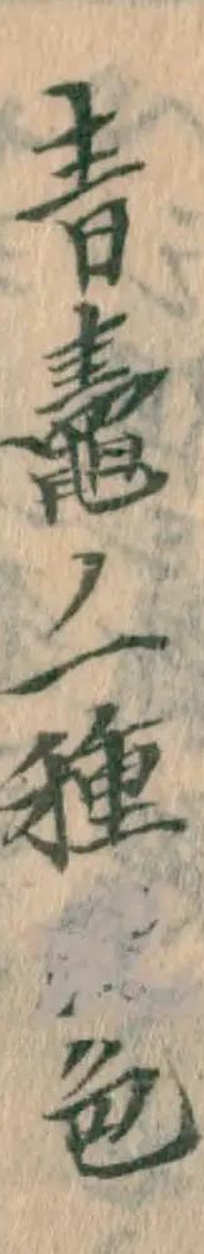青鼃ノ一種色
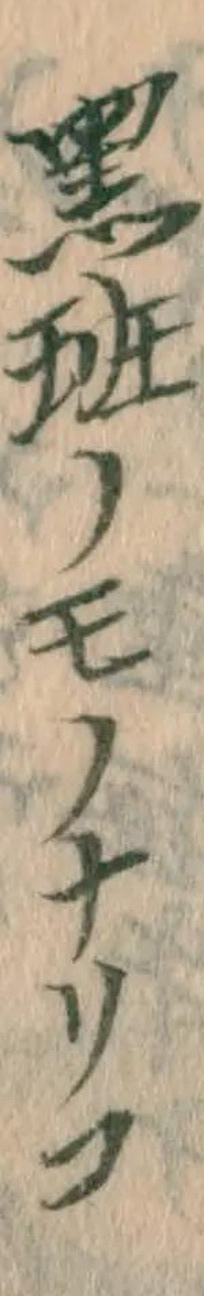黒班ノモノナリコ
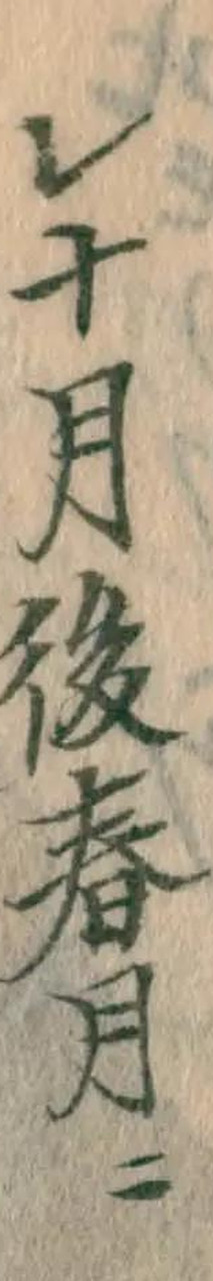レ十月後春月ニ
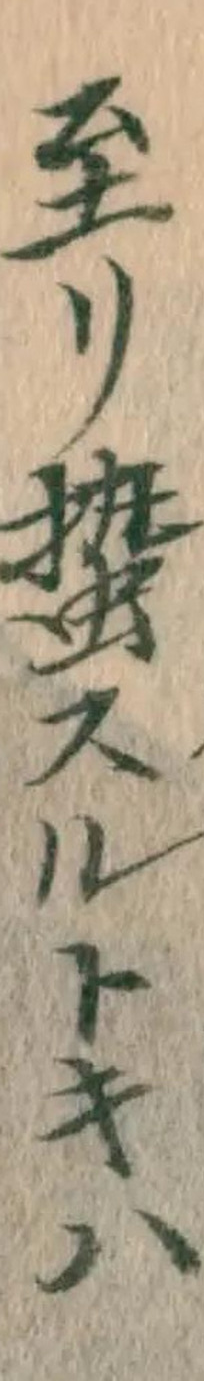至リ蟄スルトキハ
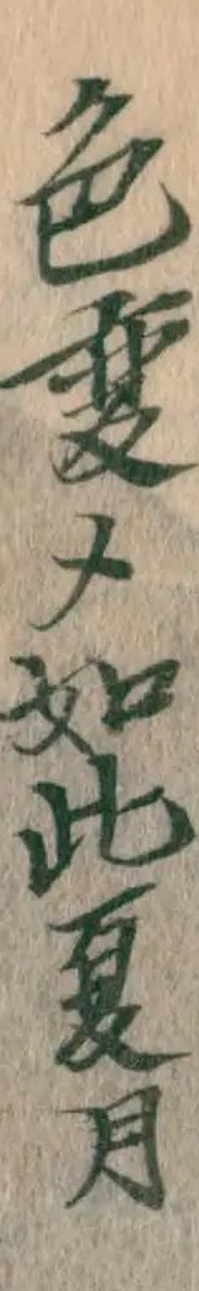色変シテ如此夏月
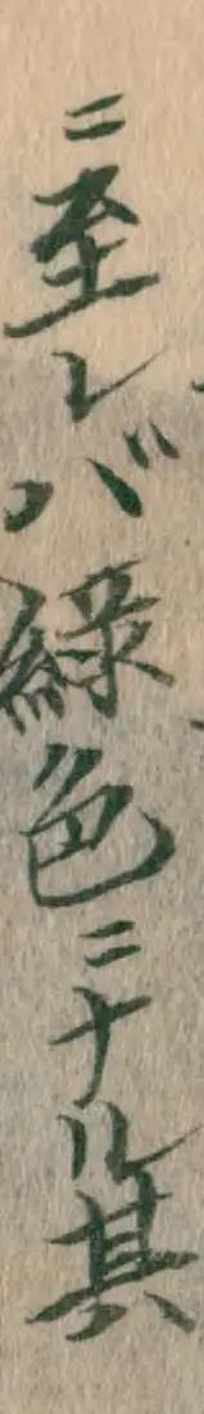ニ至レバ緑色ニナル其
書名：千蟲譜 3巻. [2]
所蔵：国立国会図書館 National Diet Library, JAPAN
